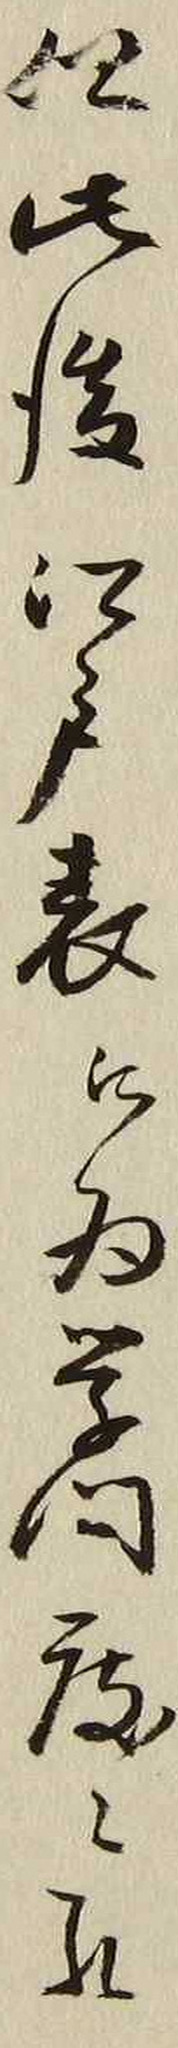但此後江戸表江為学問度々罷
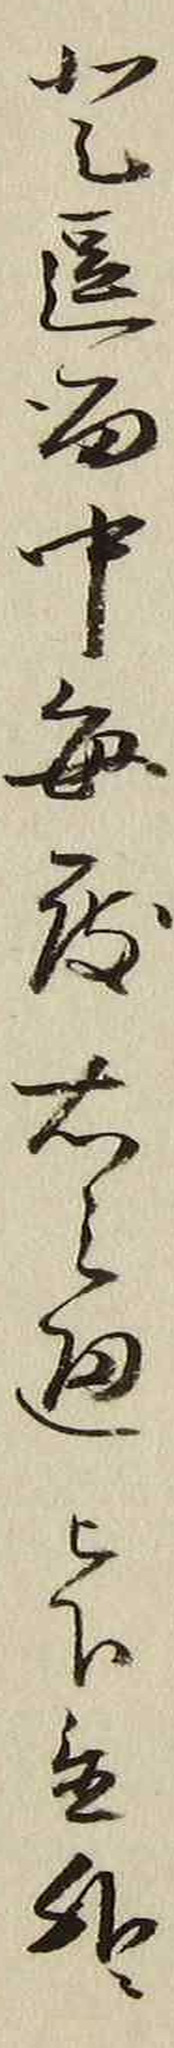登逗留中毎度右之通被下置外ニ
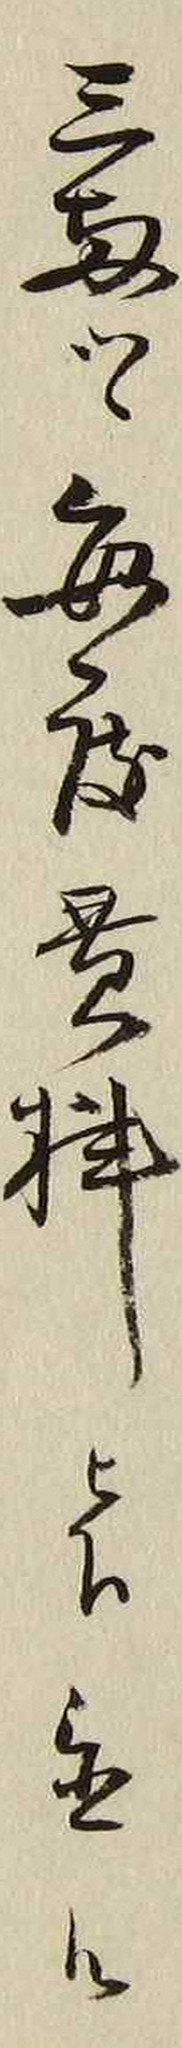三両ツヽ毎度費料被下置候
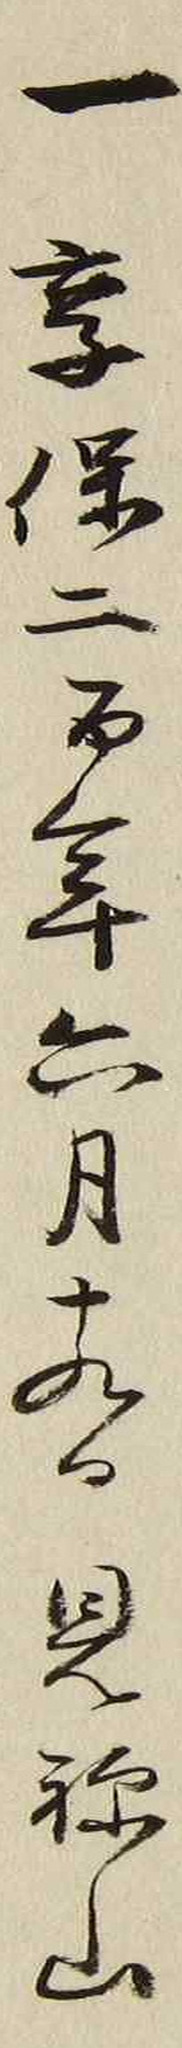一享保二酉年六月十九日見祢山
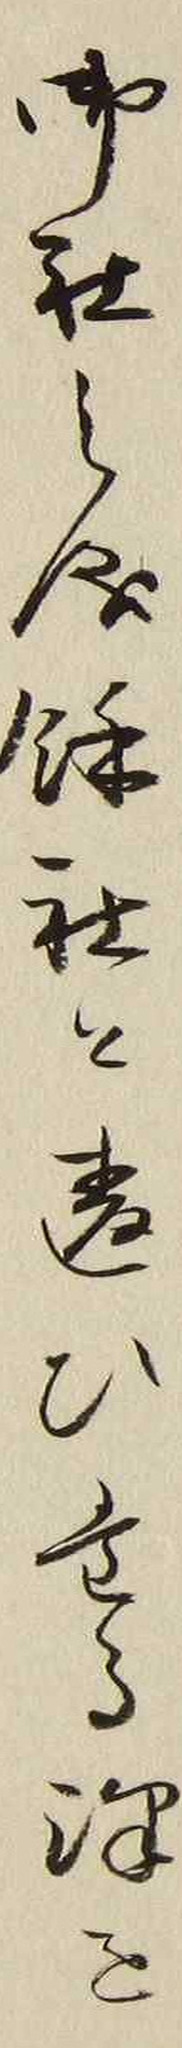御社之儀余社と違ひたる訳を
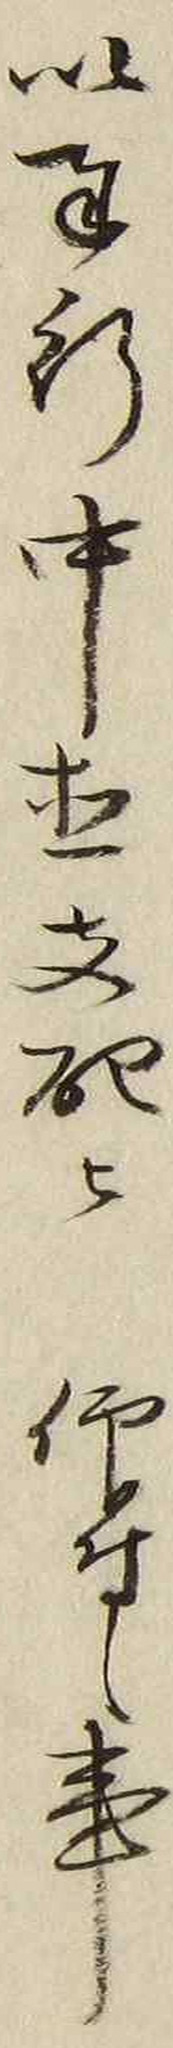以奉行中直支配被仰付候事

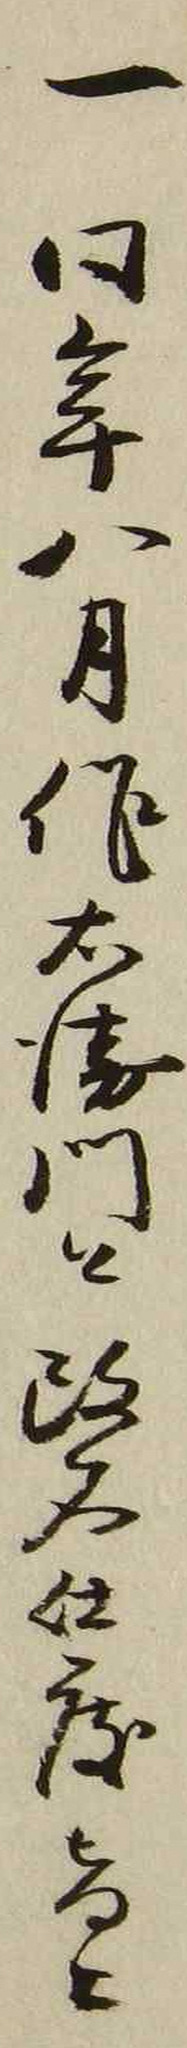一同年八月作右衛門と改名仕度旨被
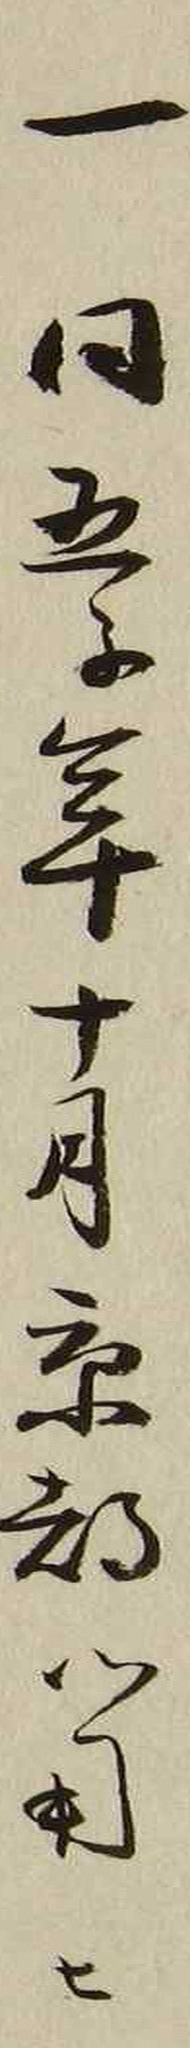一同五子年十月京都御用被
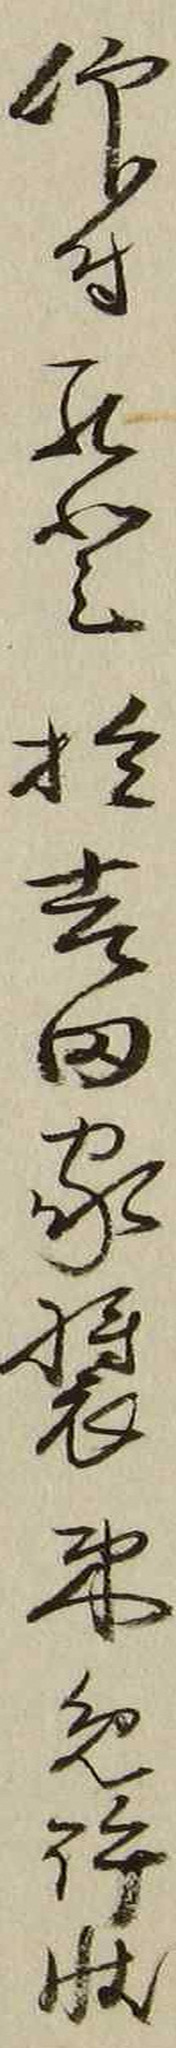仰付罷登於吉田家装束免許状
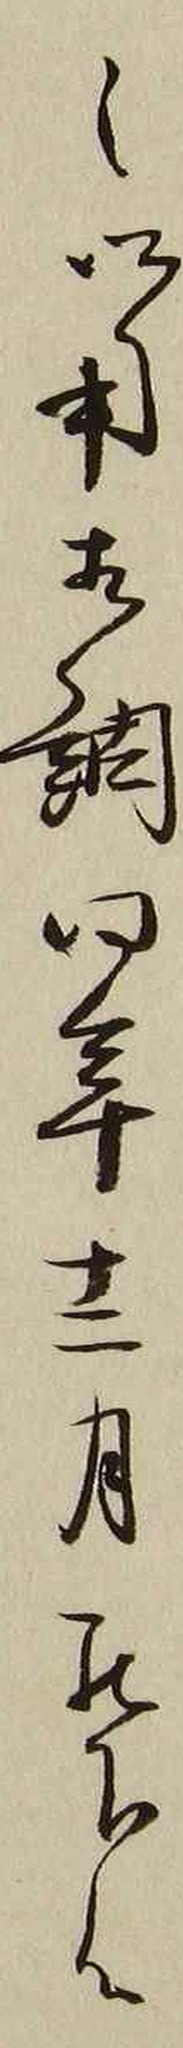之御用相調同年十二月罷下候
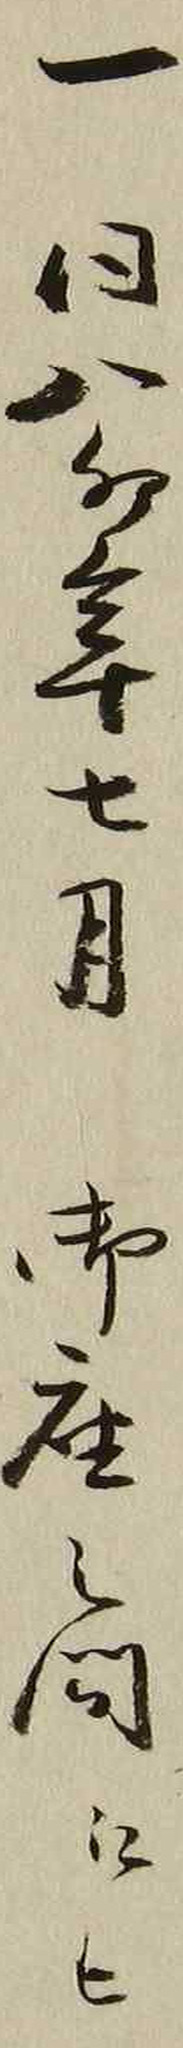一同八卯年七月御座之間江被
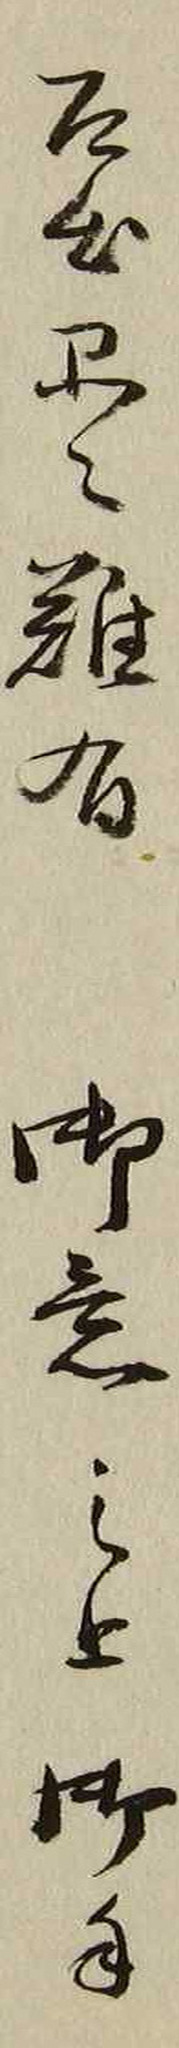召出品々難有御意之上御手
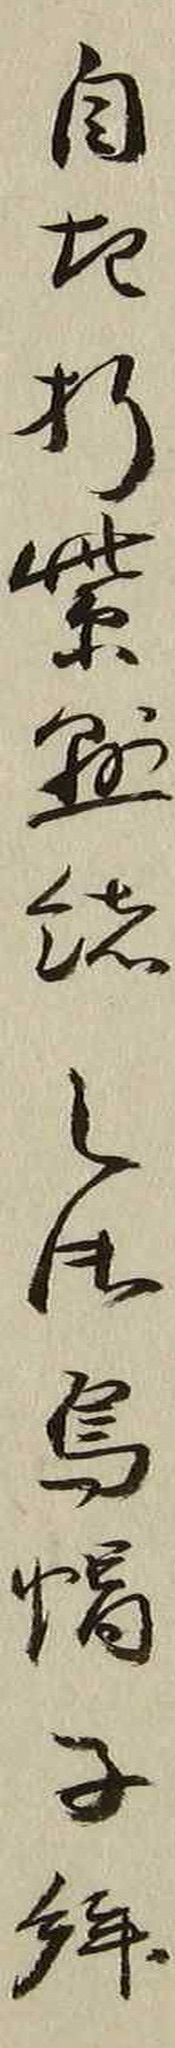自左折紫懸緒之御烏帽子拝
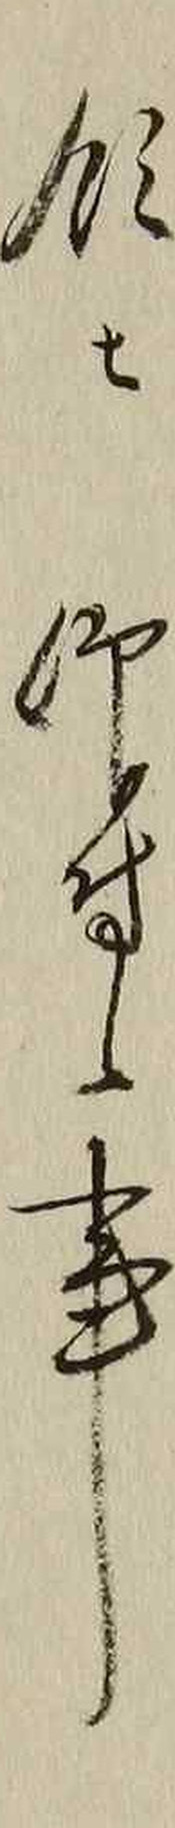領被仰付候事
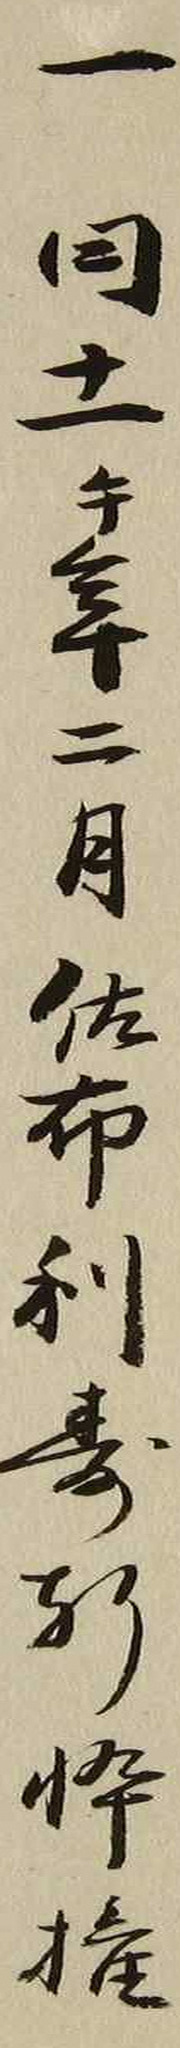一同十一午年二月佐布利寿軒忰権
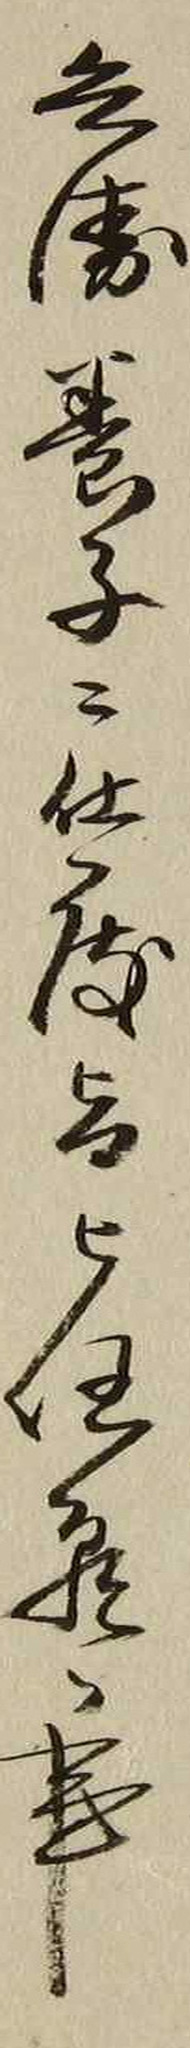兵衛養子ニ仕度旨被任願候事
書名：諸士系譜　巻之291　さ之部23
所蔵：会津若松市立会津図書館
